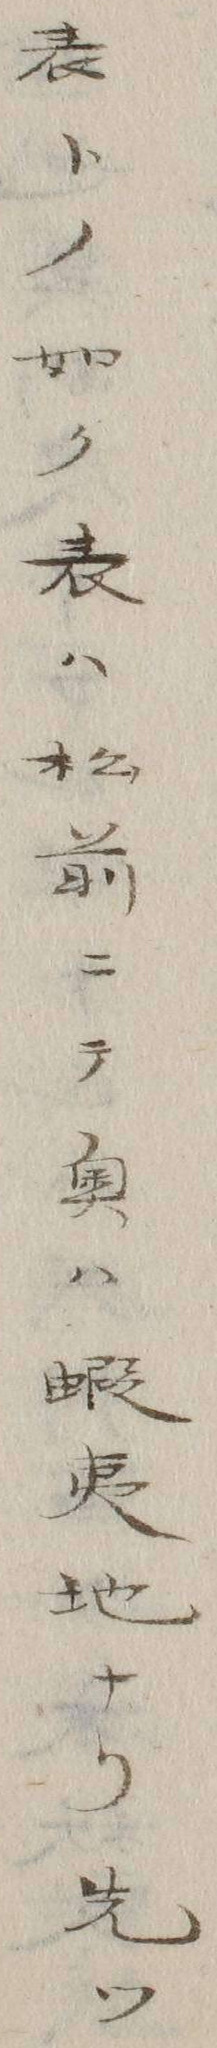表トノ如ク表ハ松前ニテ奥ハ蝦夷地ナリ先ツ
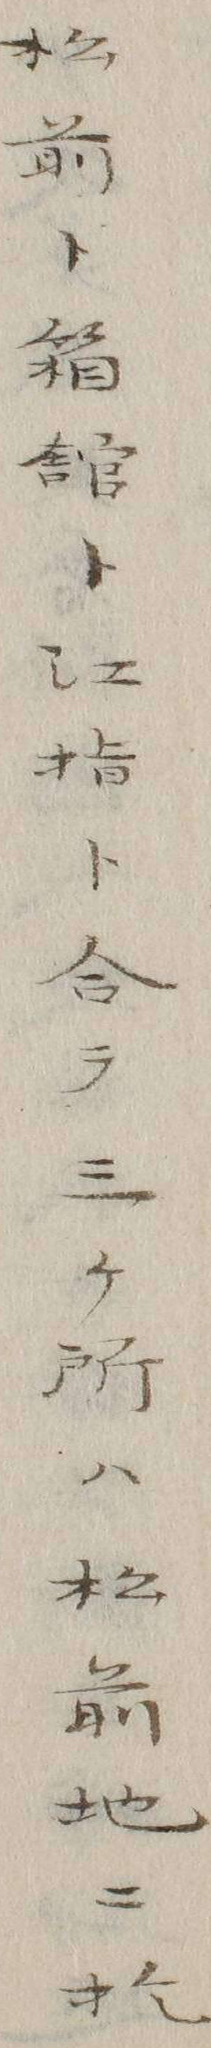松前ト箱館ト江指ト合テ三ヶ所ハ松前地ニ於
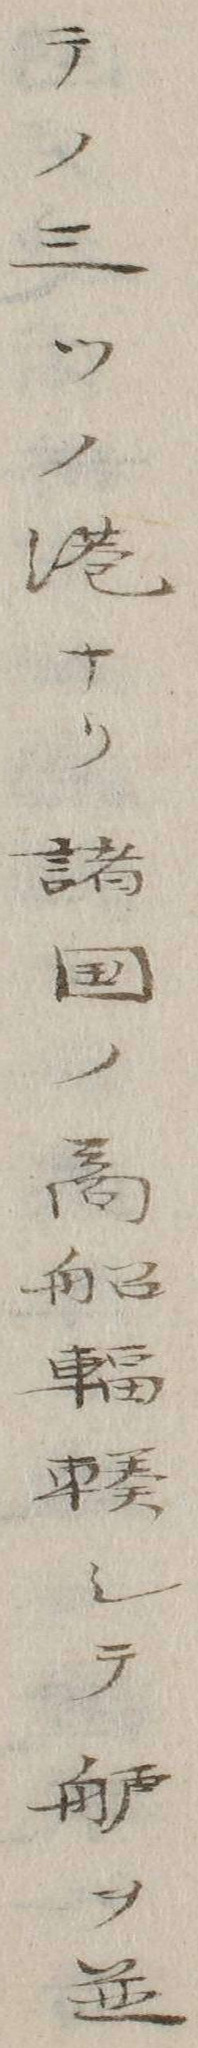テノ三ッノ港ナリ諸国ノ商船輻輳シテ舮ヲ並
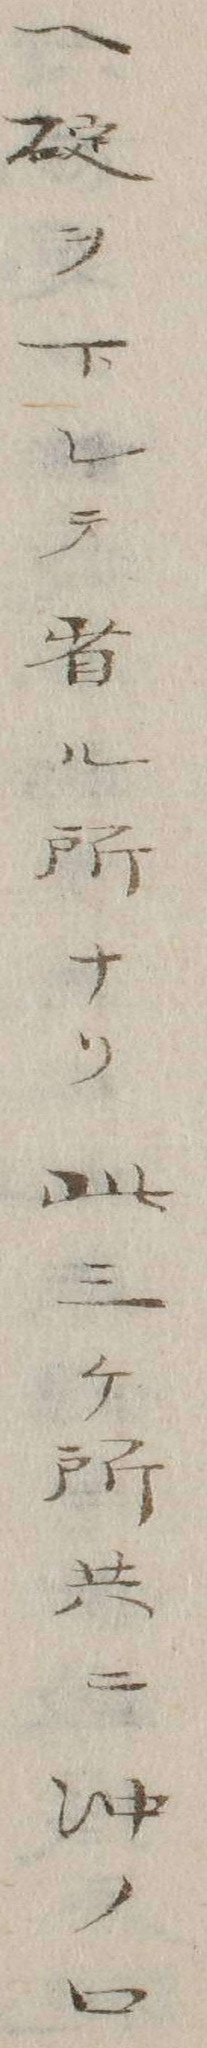ヘ碇ヲ下シテ省ル所ナリ此三ヶ所共ニ沖ノ口
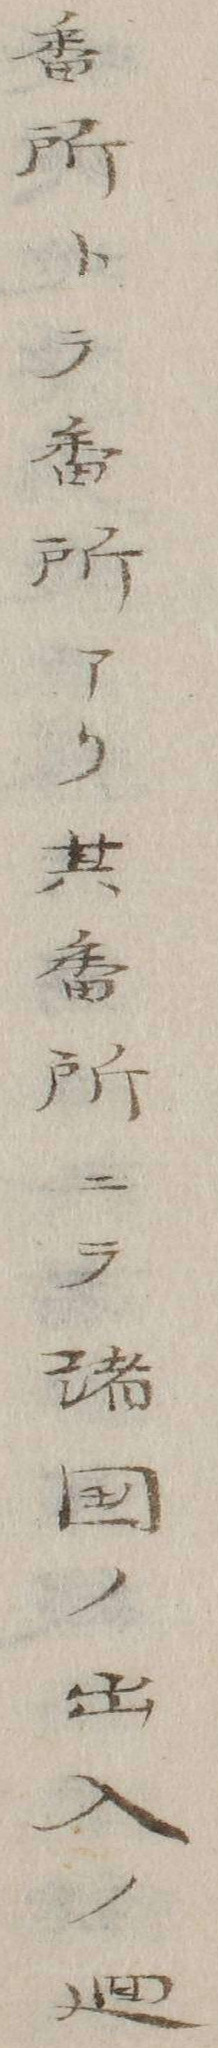番所トテ番所アリ其番所ニテ諸国ノ出入ノ廻
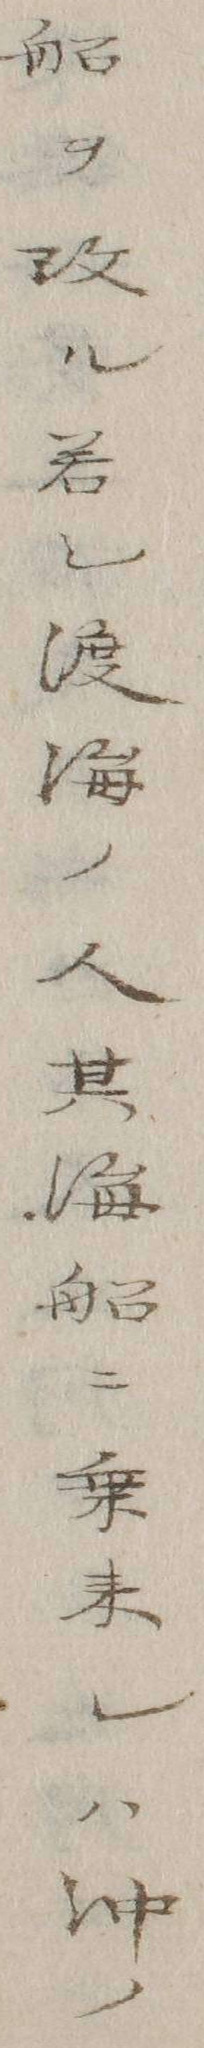船ヲ改ル若シ渡海ノ人其海船ニ乗来レハ沖ノ
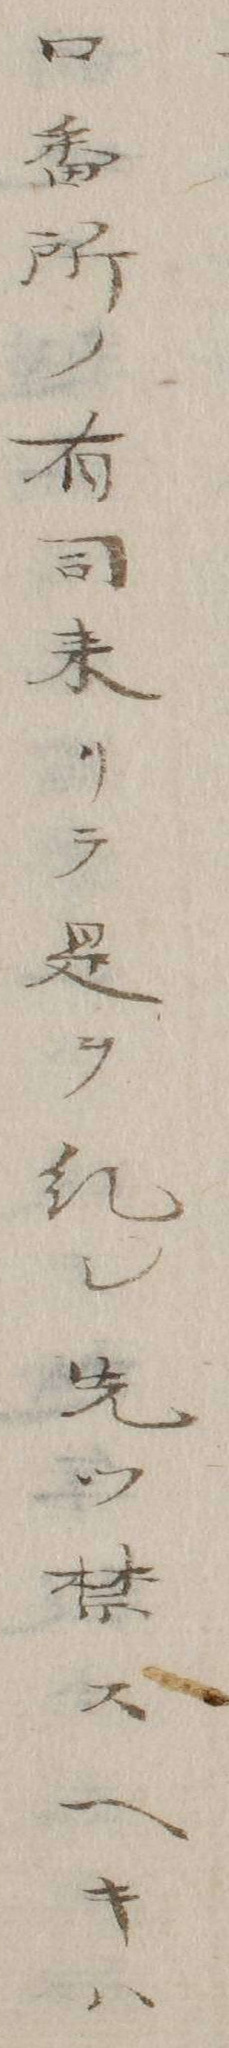口番所ノ有司来リテ是ヲ糺シ先ツ禁スヘキハ
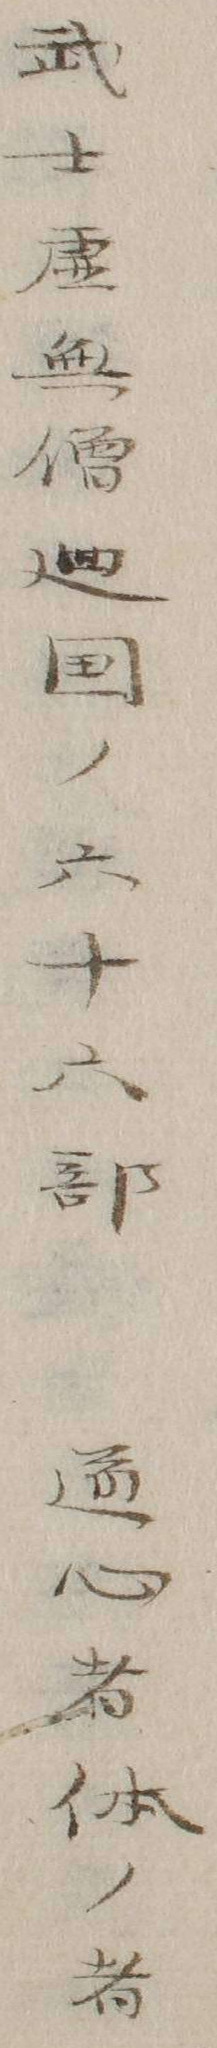武士虚無僧廻国ノ六十六部道心者体ノ者
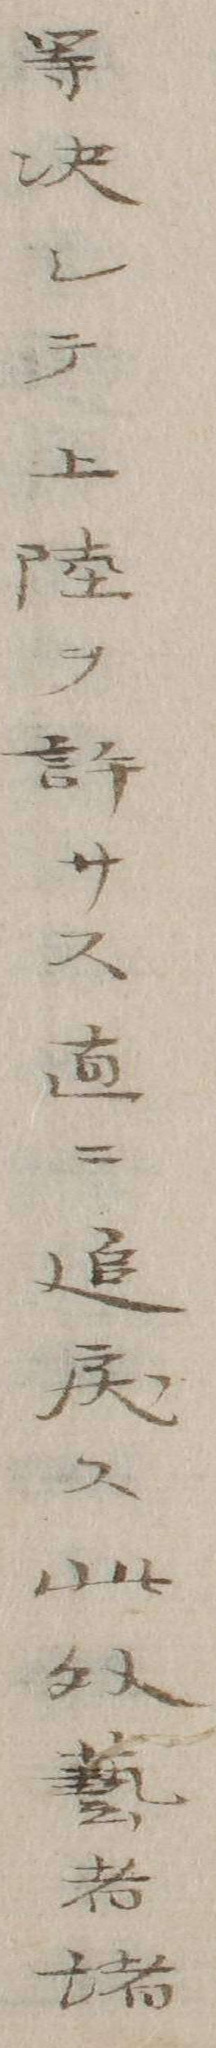等決シテ上陸ヲ許サス直ニ追戻ス此外芸者諸

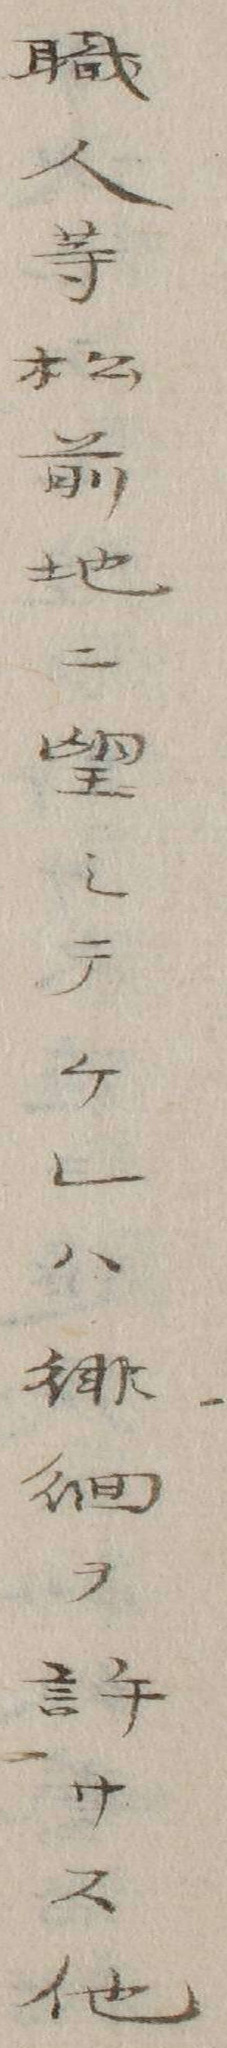職人等松前地ニ望ミテケレハ徘徊ヲ許サス他
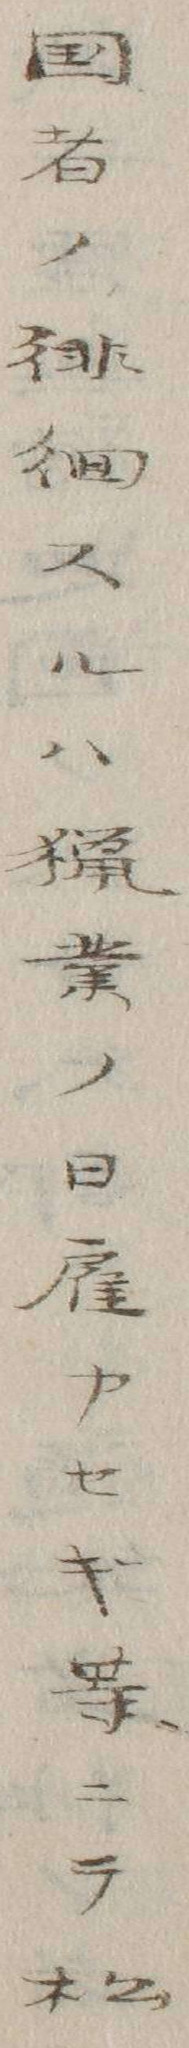国者ノ徘徊スルハ猟業ノ日雇カセギ等ニテ松
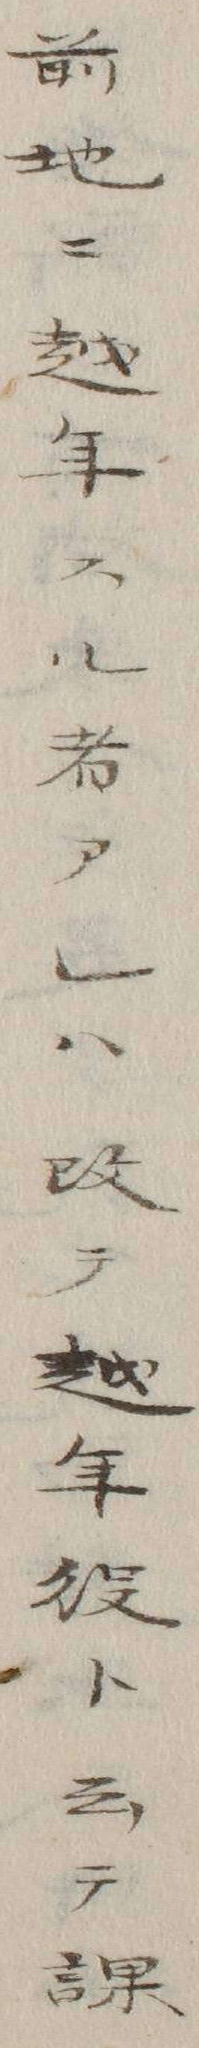前地ニ越年スル者アレハ改テ越年役ト云テ課
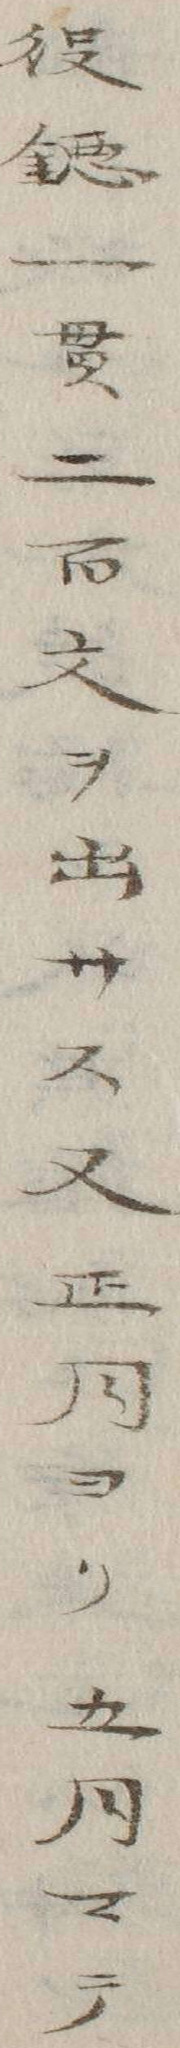役鐚一貫二百文ヲ出サス又正月ヨリ五月マテ
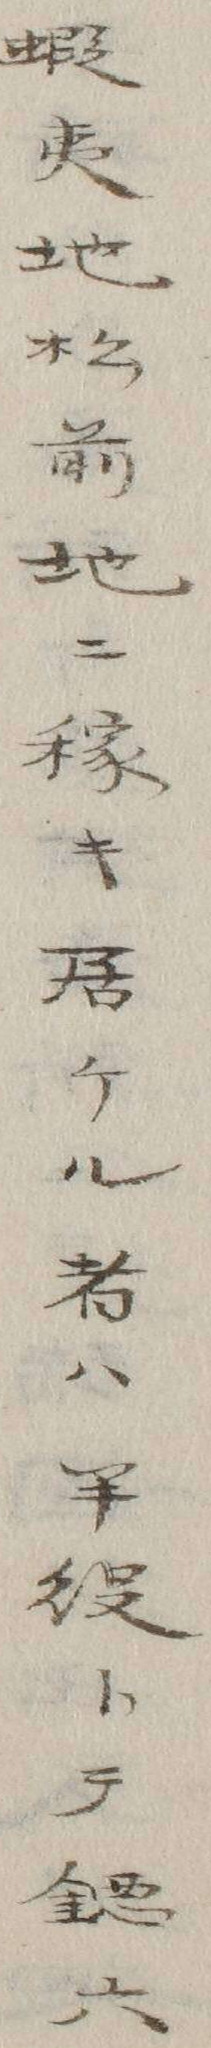蝦夷地松前地ニ稼キ居ケル者ハ半役トテ鐚六
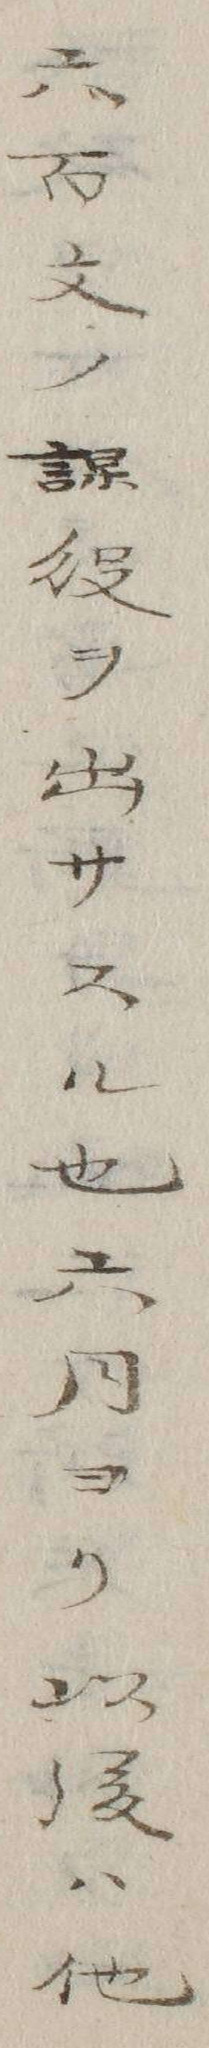六百文ノ課役ヲ出サスル也六月ヨリ以後ハ他
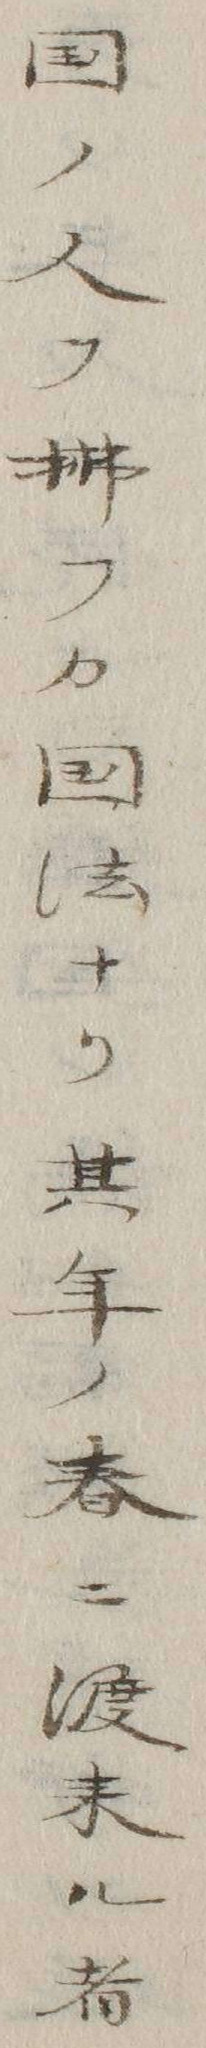国ノ人ヲ払フカ国法ナリ其年ノ春ニ渡来ル者
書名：蝦夷草紙（国文学研究資料館）
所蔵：国文学研究資料館
